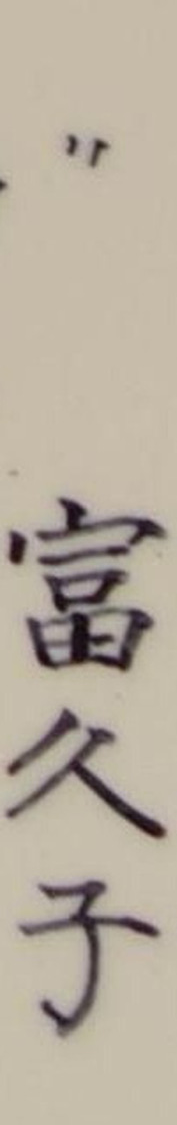富久子
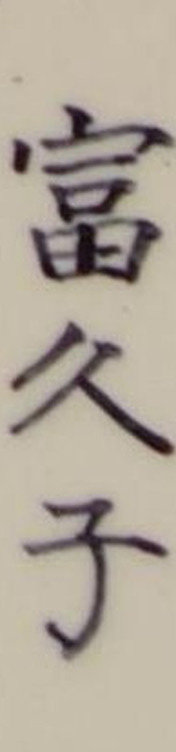富久子
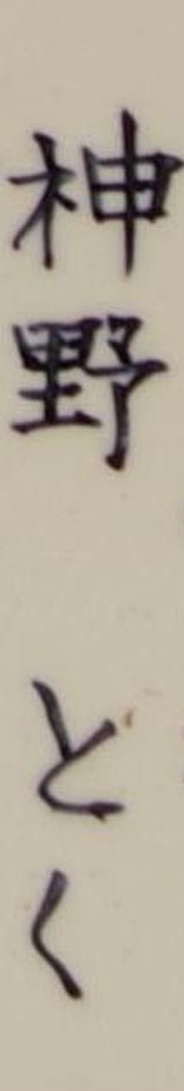神野とく
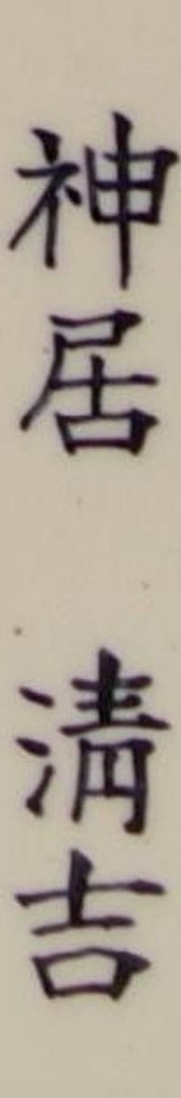神居清吉
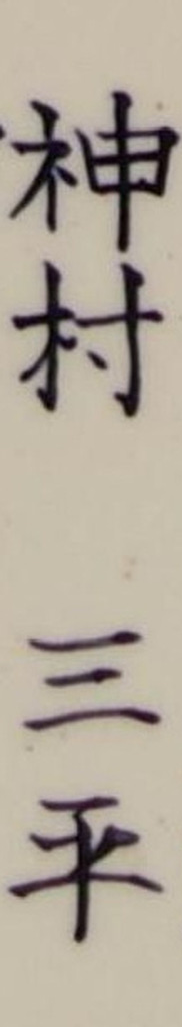神村三平
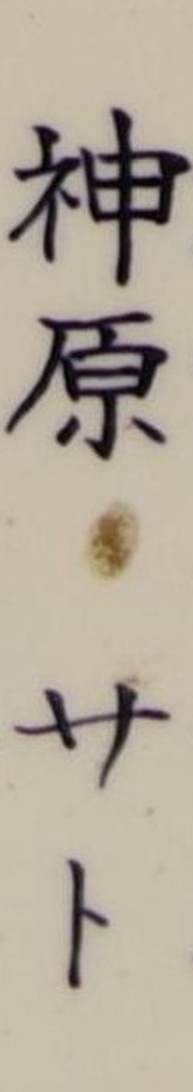神原サト
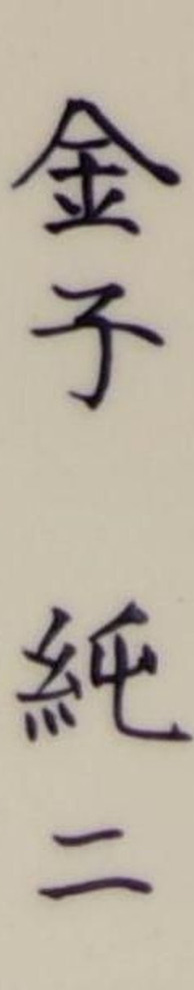金子純二
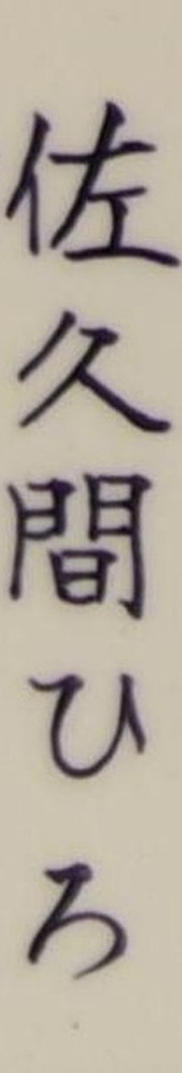佐久間ひろ
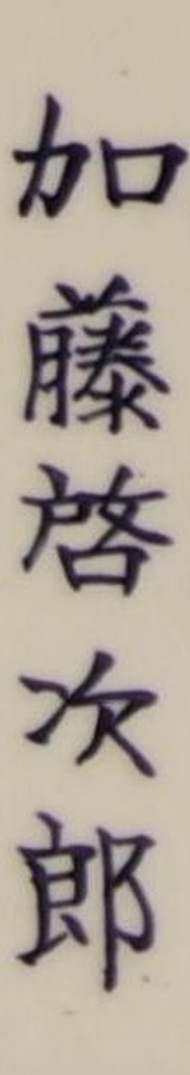加藤啓次郎

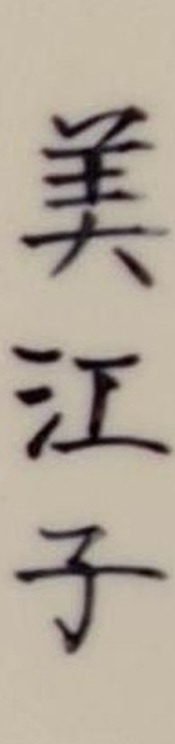美江子
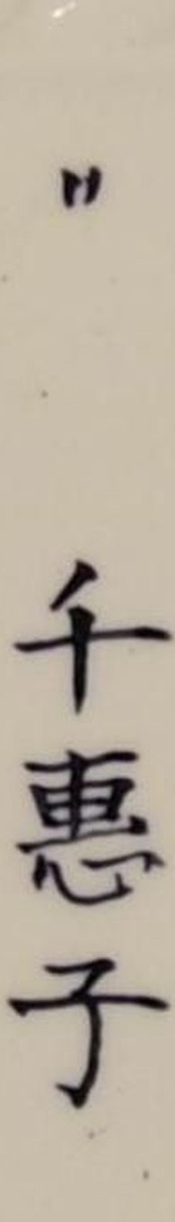千恵子
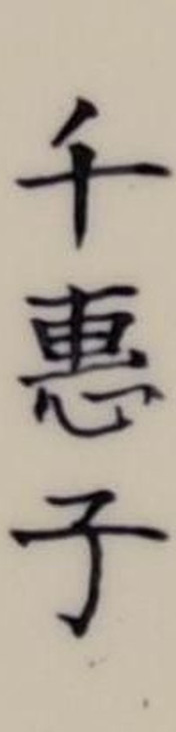千恵子
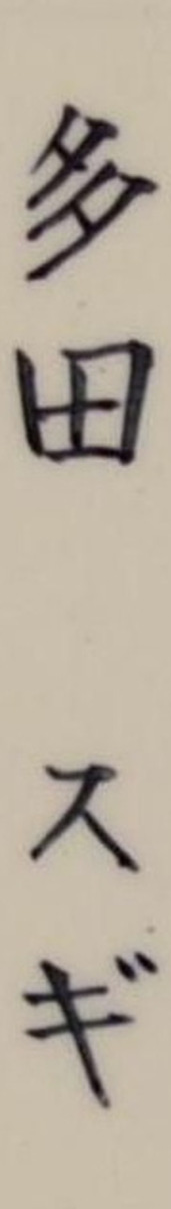多田スギ
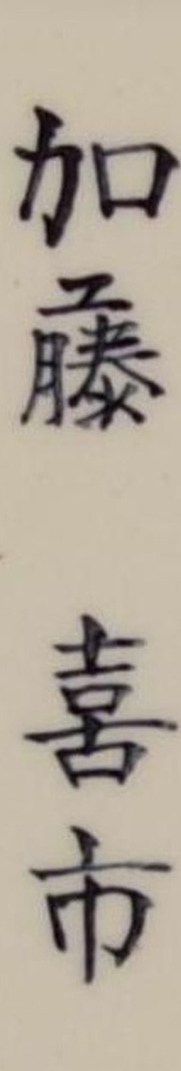加藤喜市
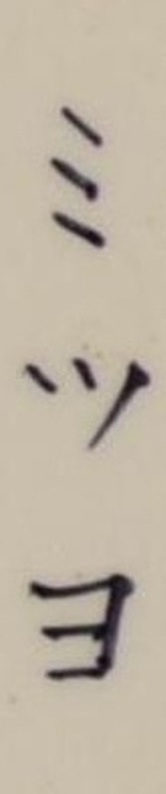ミツヨ
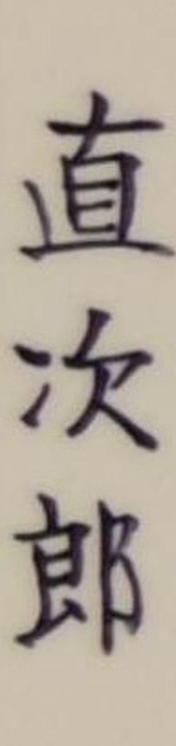直次郎
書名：M~S
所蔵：高野山金剛峯寺
